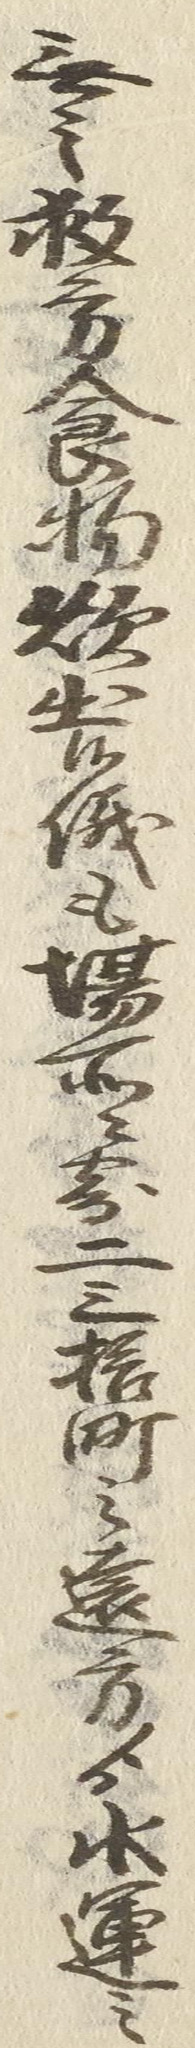無之救方食物炊出候儀も場所ニ寄二三拾町之遠方より水運之
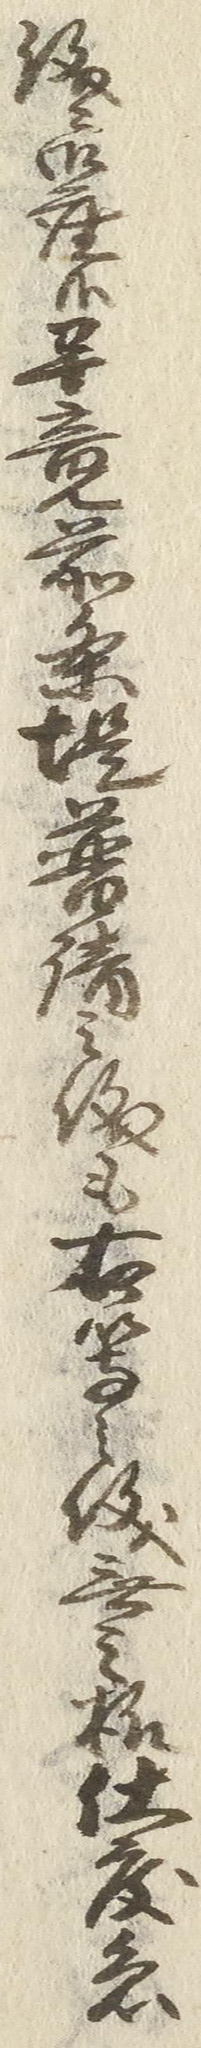儀ニ御座候畢竟前条堤普請之儀も右等之儀無之様仕度急
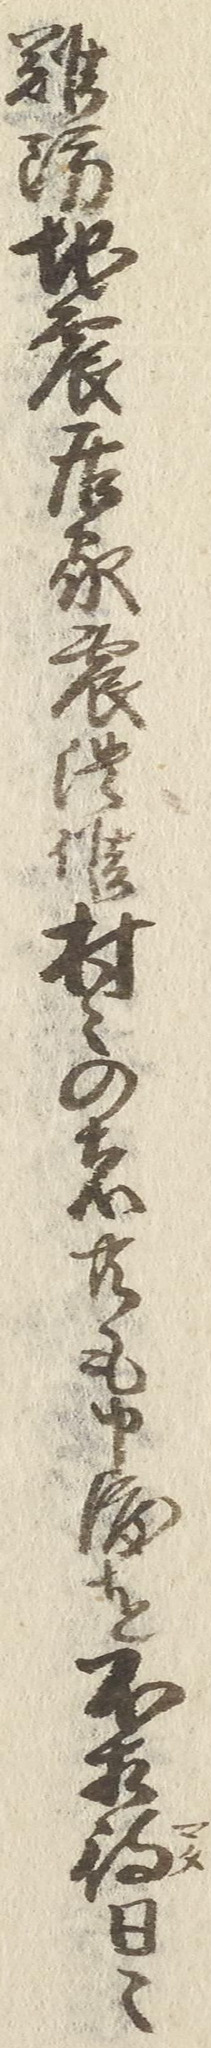難防地震居家震潰候村々の者共も申渡を不相待マタ日々
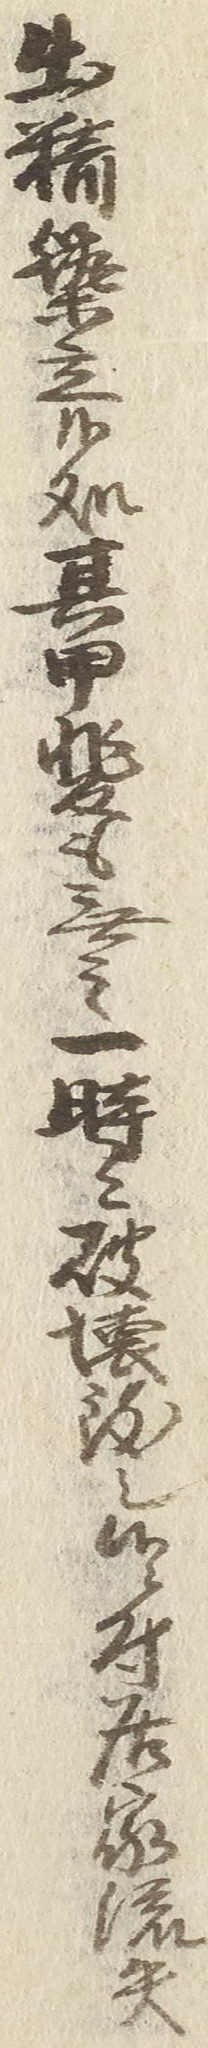出精築立候処其甲斐も無之一時々破壊致シ候ニ付居家流失
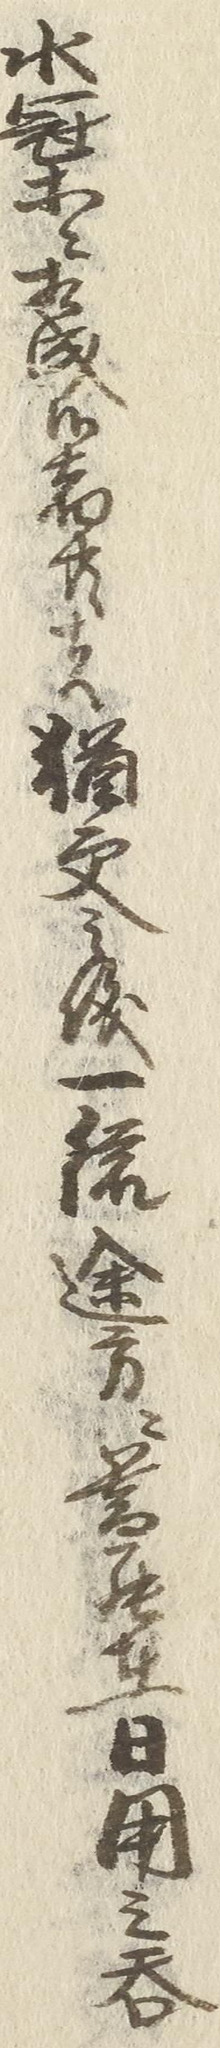水冠等ニ相成候者共は猶更之儀一統途方ニ暮罷在日用之呑
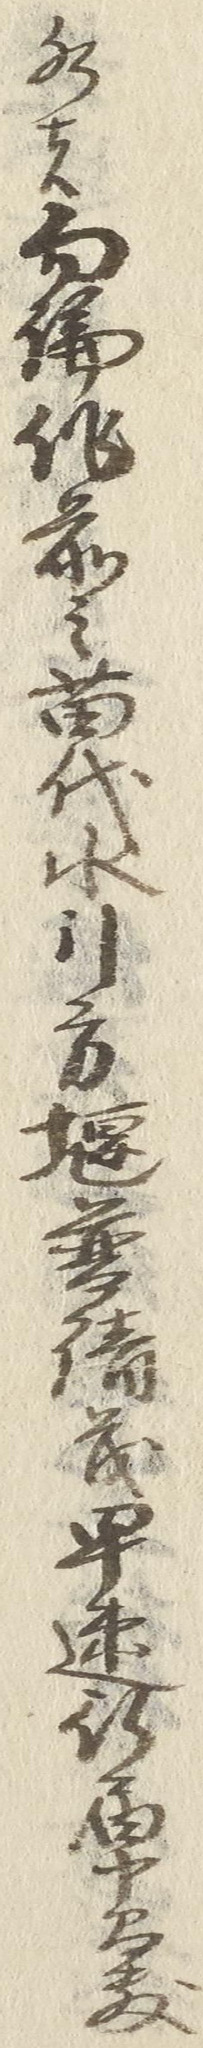水は勿論作前之苗代水引方堰普請も早速行届申間敷
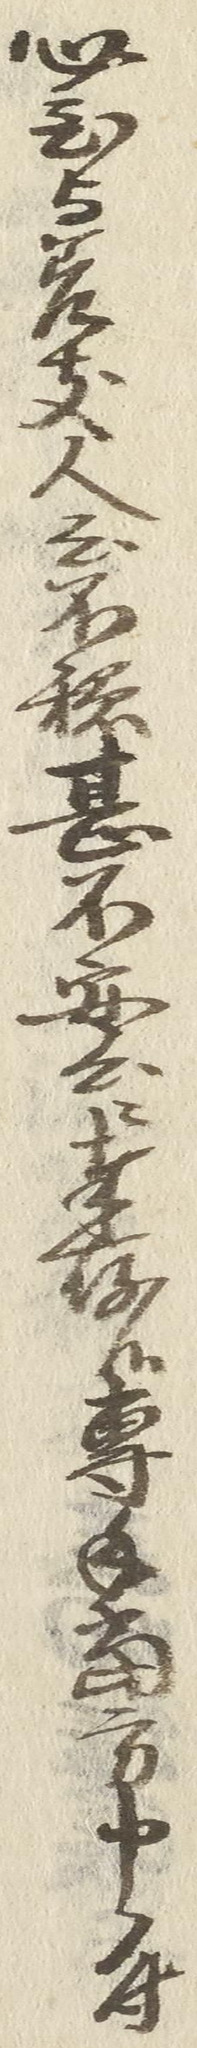必至与差支人心不穏甚不安心ニ奉存候専手当方申付
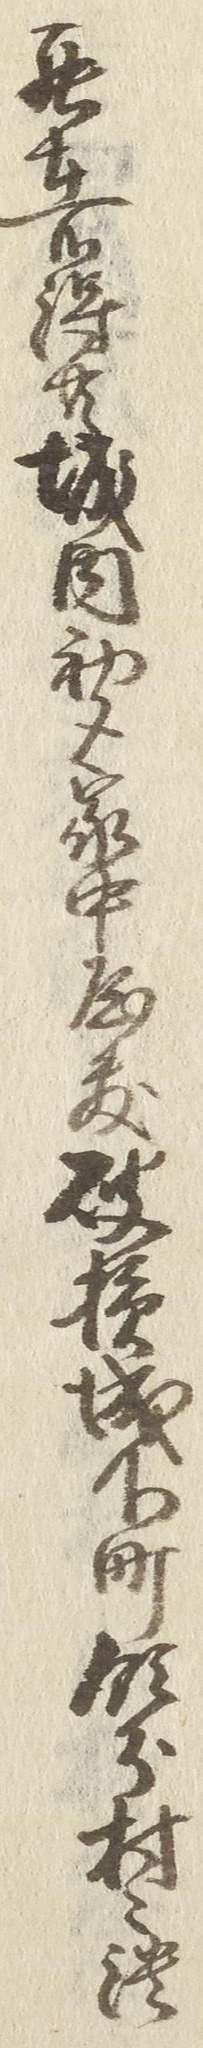罷在候得共城内初メ家中屋敷破損城下町領分村々潰
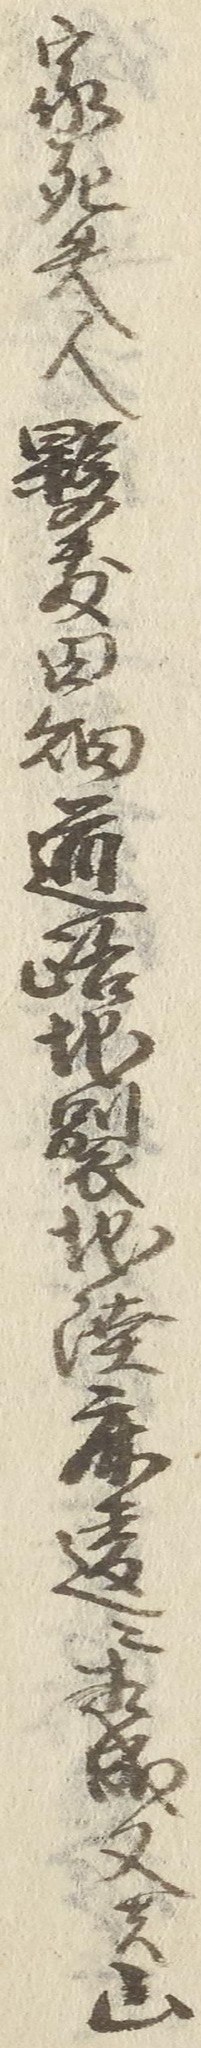家死失人夥敷田畑道路地裂地陸床違ニ相成又は山
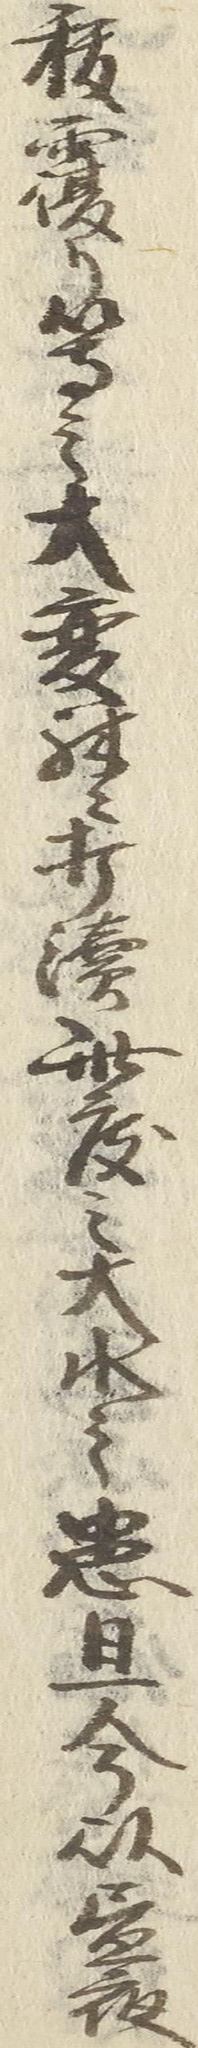抜覆り等之大変殊々内続此度之大水之患且今以昼夜

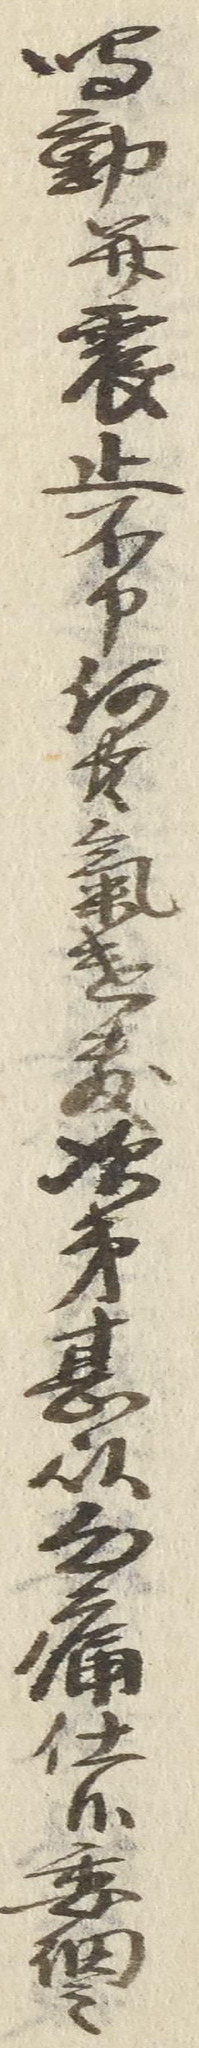鳴動并震止不申何共気遣敷次第甚以心痛仕候委細之
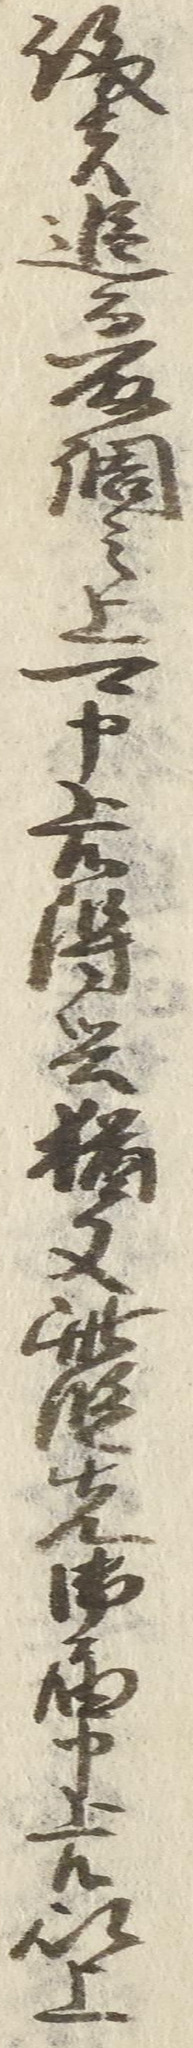儀は追而取調之上可申上候得共猶又此段先御届申上候以上
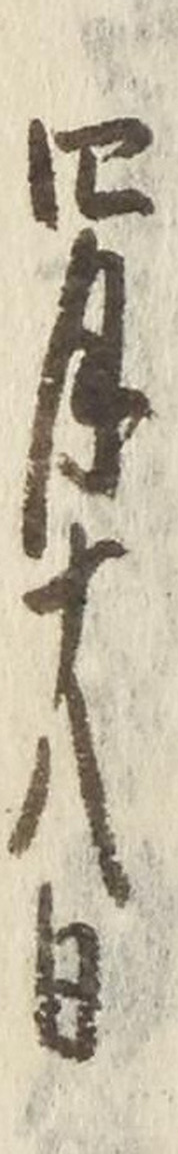四月十八日
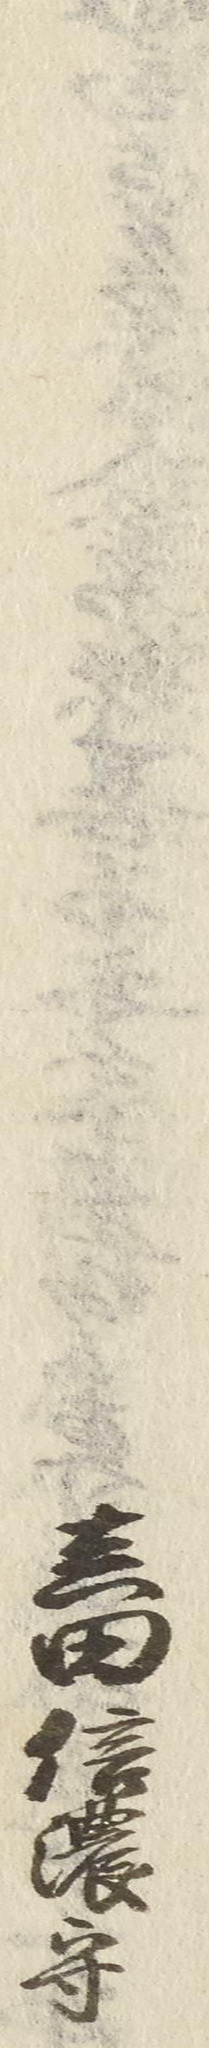真田信濃守
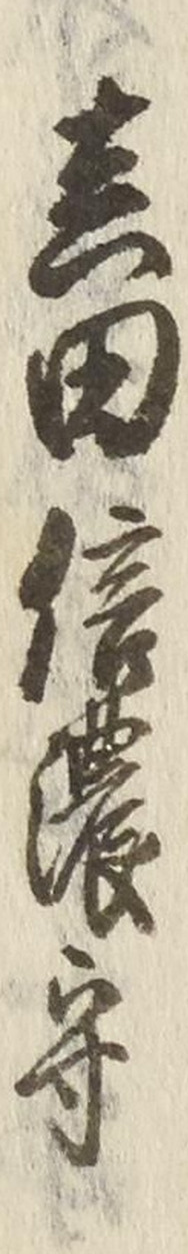真田信濃守
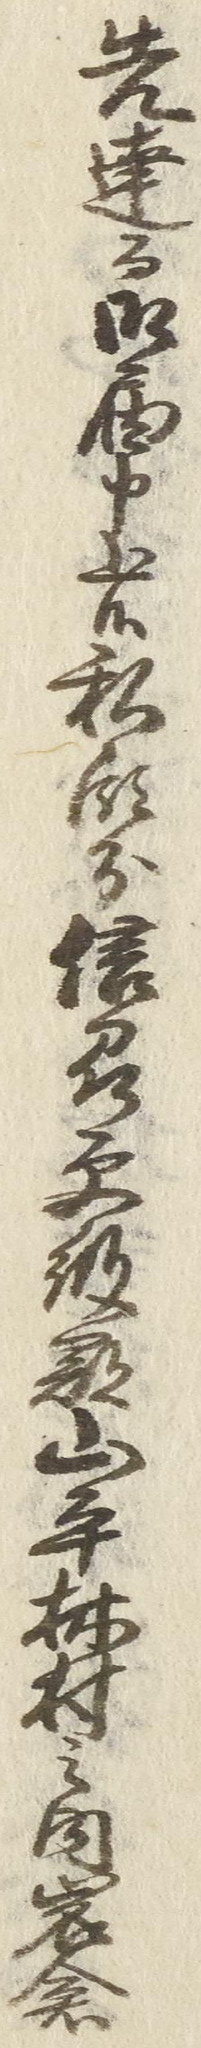先達而御届申上候私領分信州更級郡山平林村之内岩倉
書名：従往古地震御届書記誌之一
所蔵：東京大学地震研究所図書室 Earthquake Research Institute Library, The University of Tokyo, JAPAN
